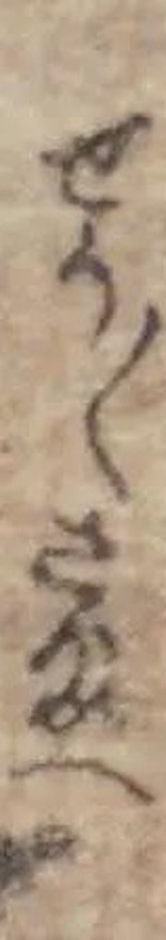せう〳〵さまへ
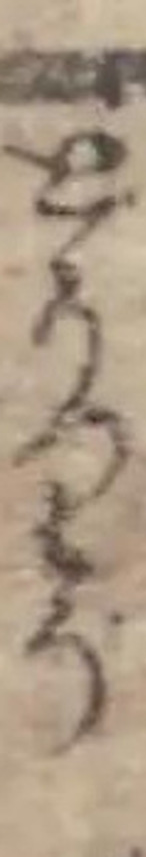とうりう
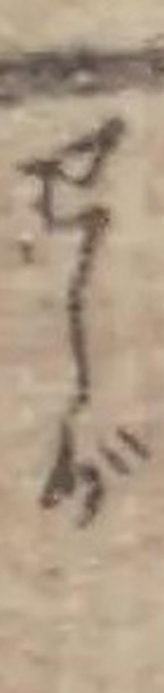せしが
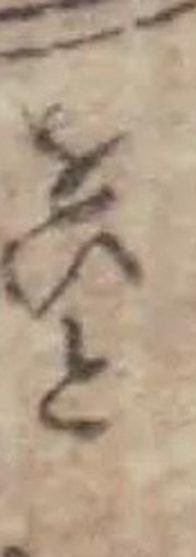をいと
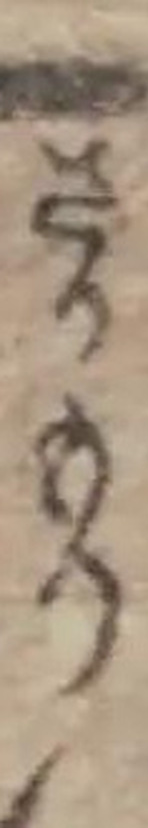さかもり
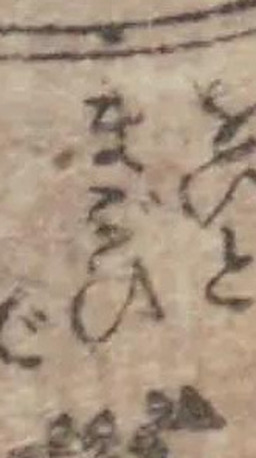まごひ
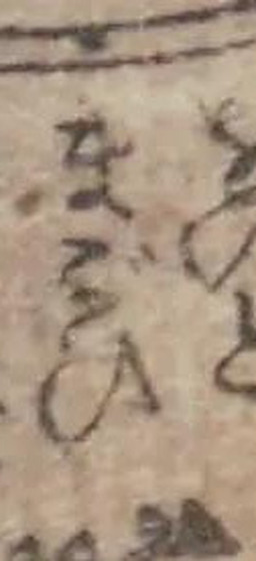まごひ
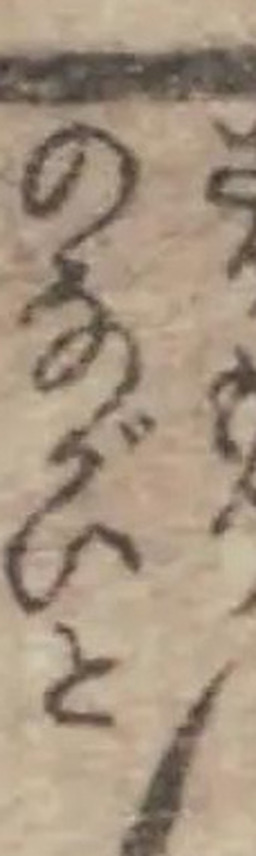のながいと
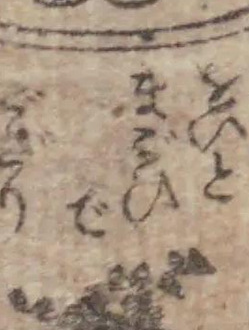まごひ
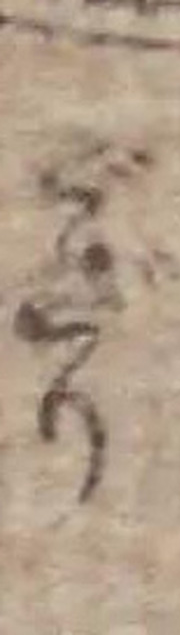ござり
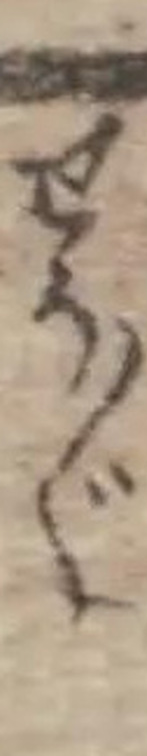せう〴〵
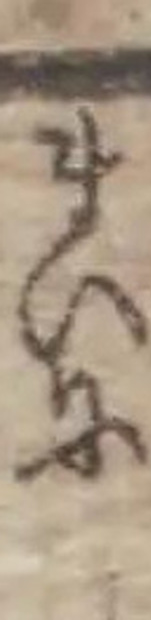まいに
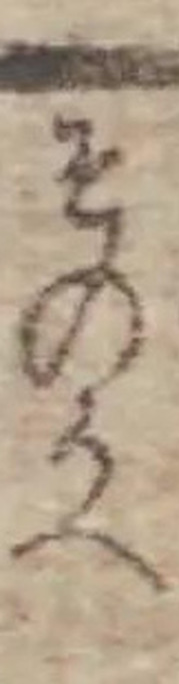そのうへ
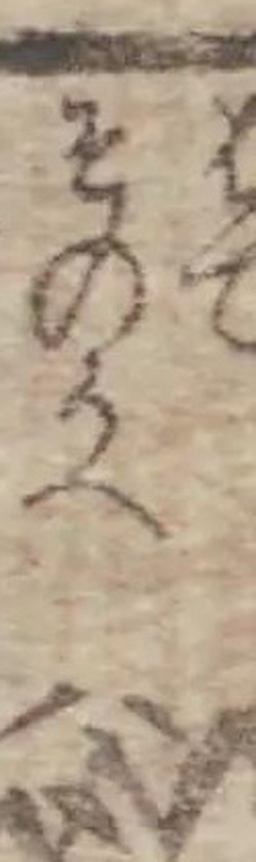そのうへ
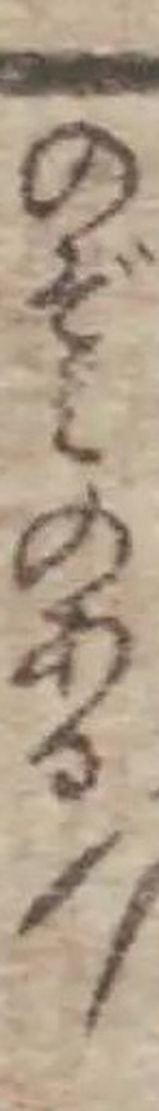のぞミのある
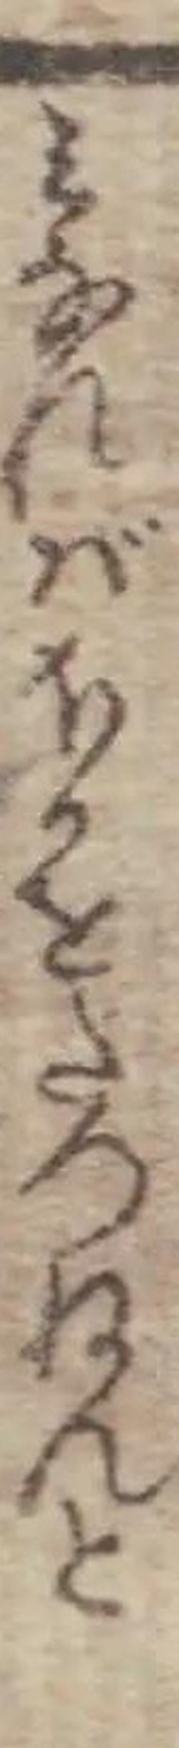ミなれバほかをたつねんと
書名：草紙の曙 3巻
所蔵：国立国会図書館 National Diet Library, JAPAN
